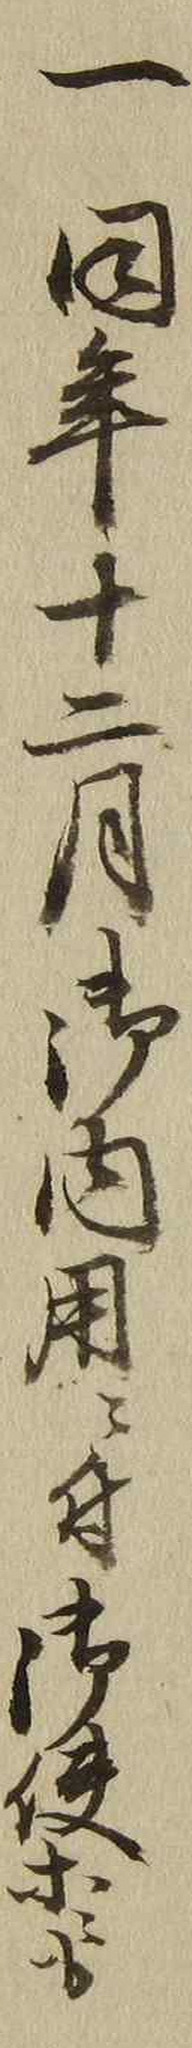一同年十二月御内用ニ付碁使等ニも
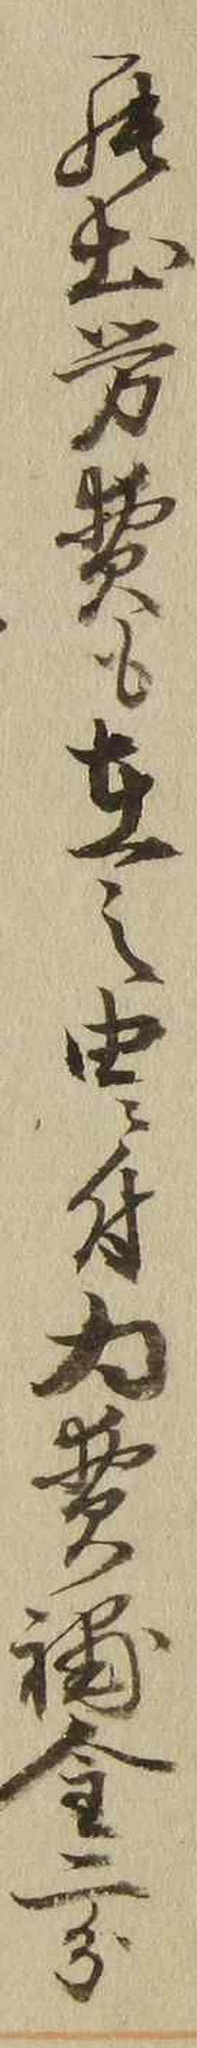罷出労費も在之由ニ付為費補金ニ分
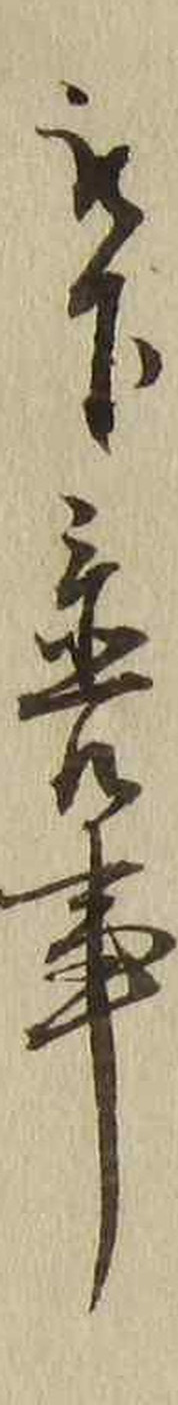被下置候事

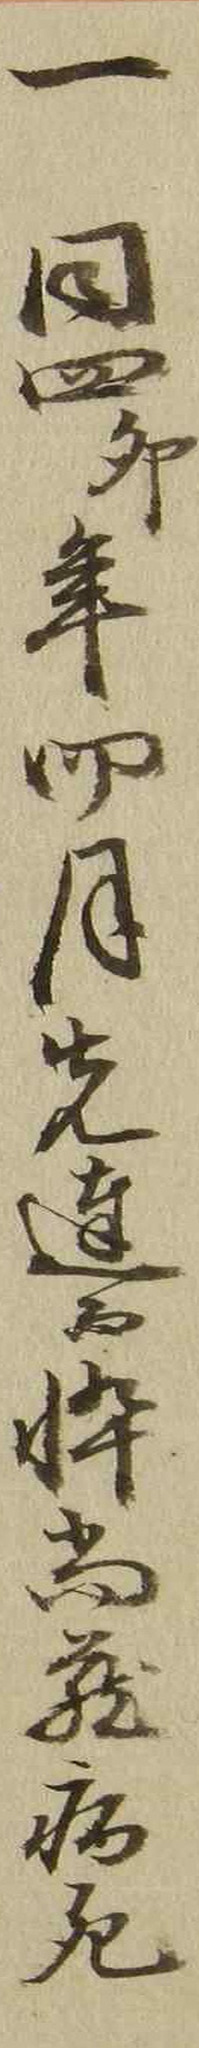一同四卯年四月先達而忰尚蔵病死
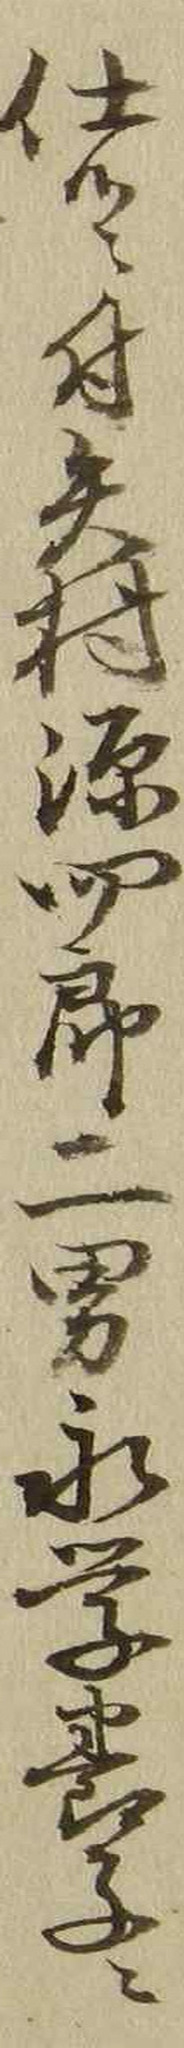仕候ニ付矢村源四郎二男永学養子ニ
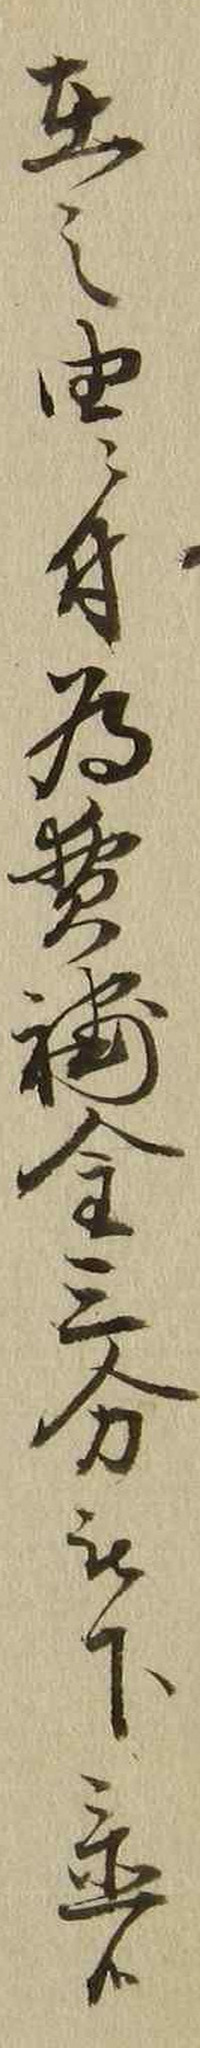在之由ニ付費補金三分被下置候
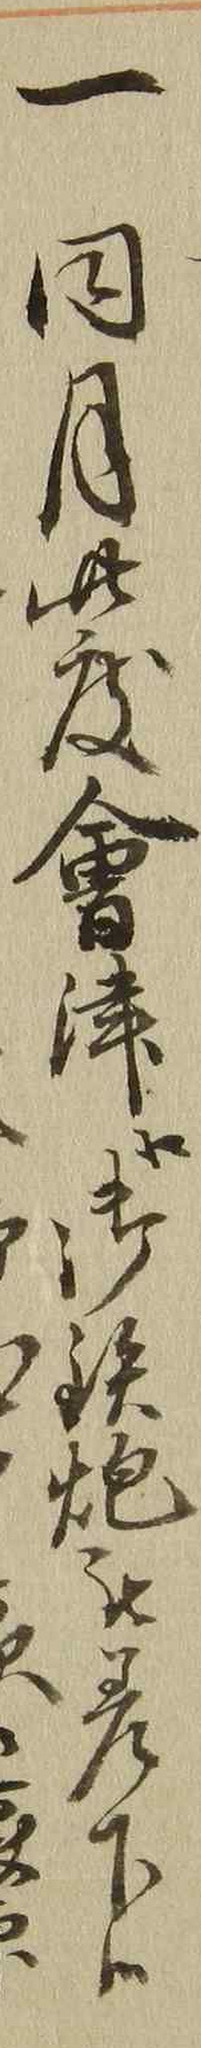一同月此度会津江御鉄砲被差下候
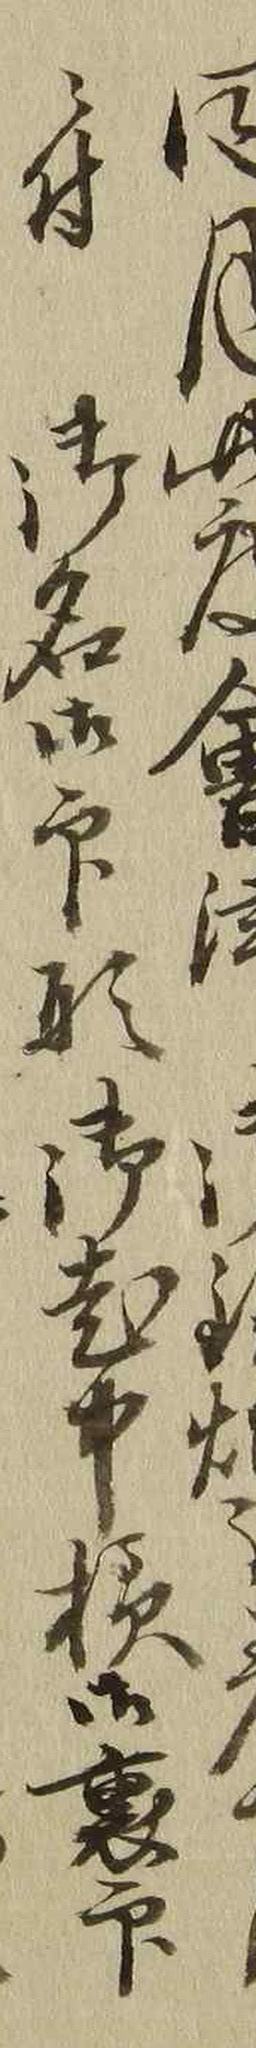ニ付御名御印形御老中様御裏印
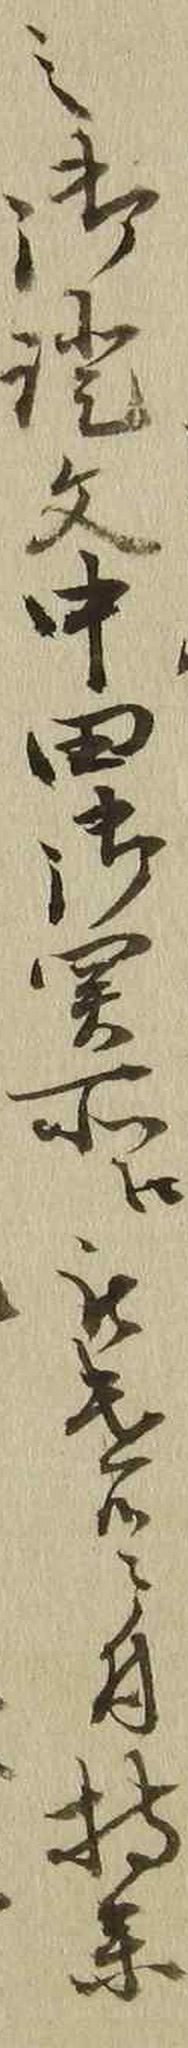之御証文中田御関所江被遣候ニ付持参
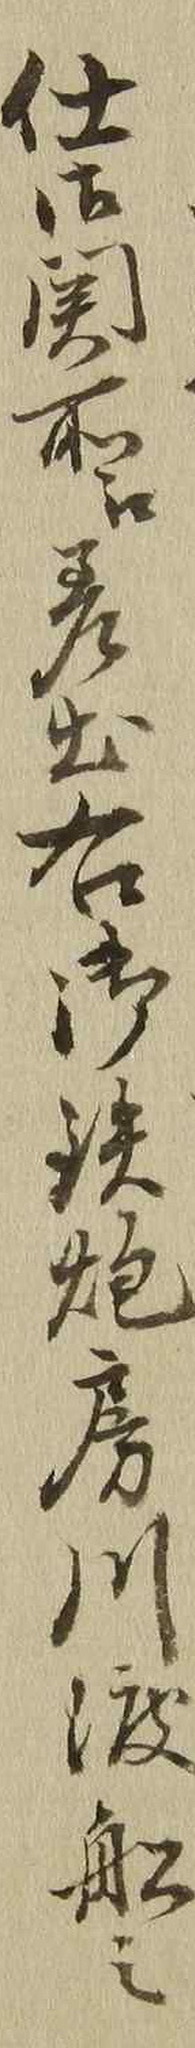仕御関所江差出右御鉄砲房川渡船之
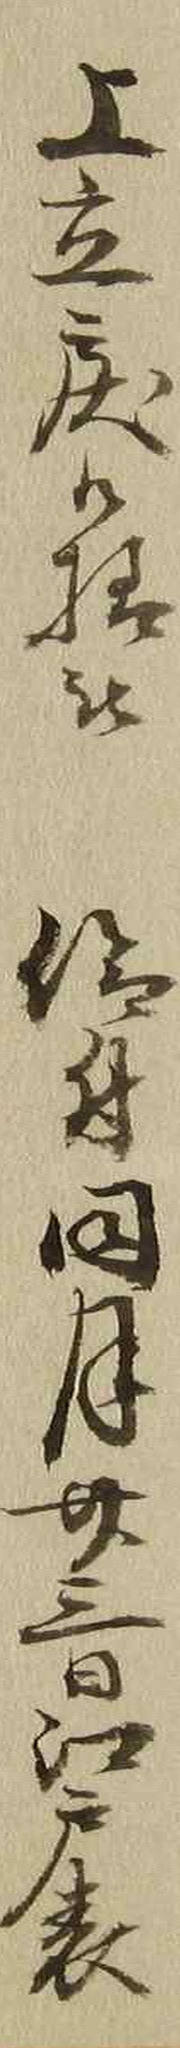上立戻候様被仰付同月廿三日江戸表
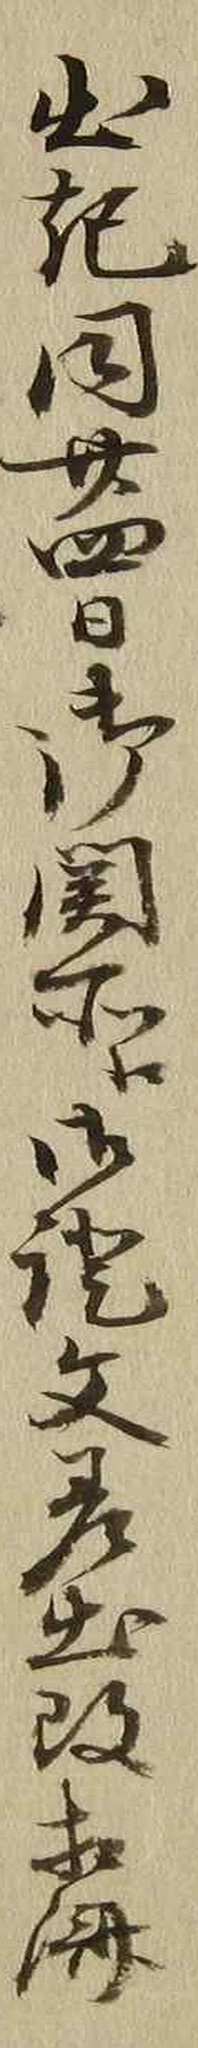出起同廿四日御関所江御証文差出改相済
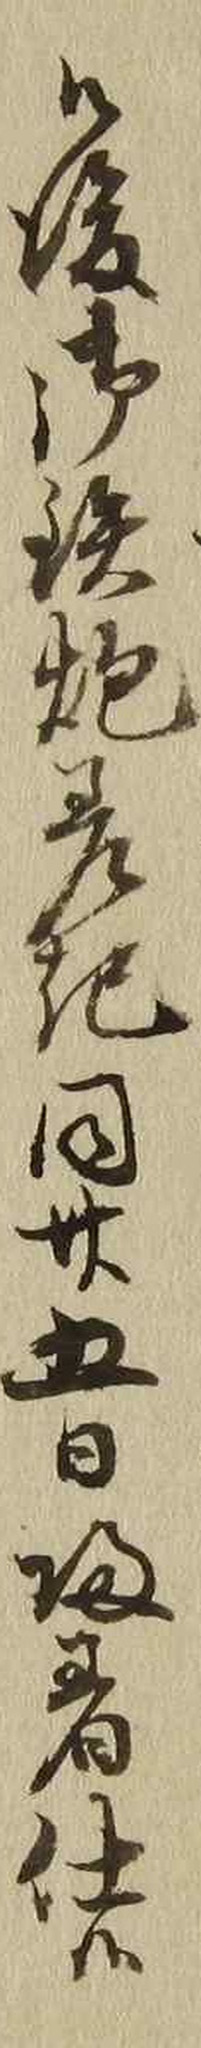候後御鉄砲差起同廿五日帰着仕候
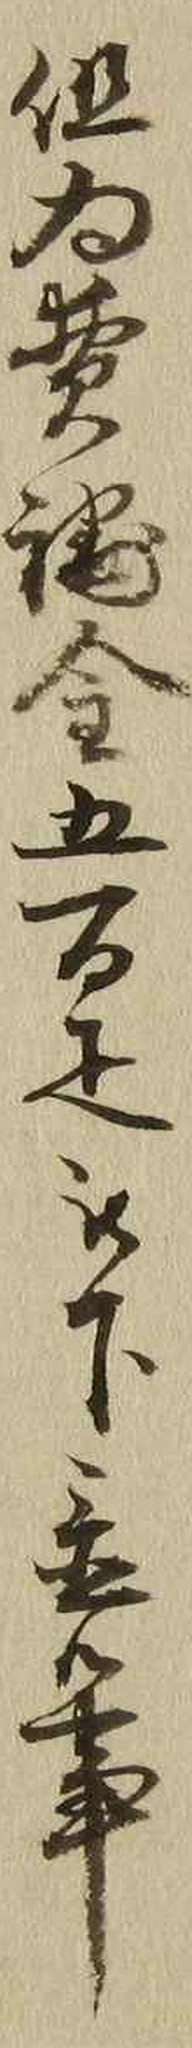但為費補金五百疋被下置候事
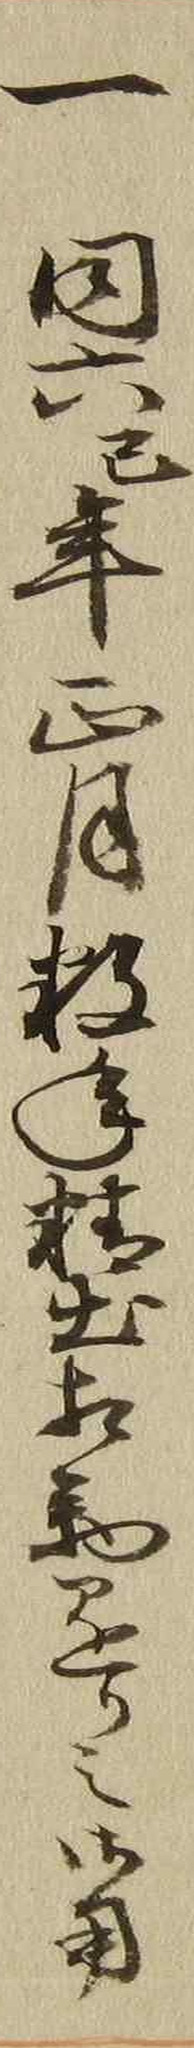一同六巳年正月数年精出相勤懸り之御用
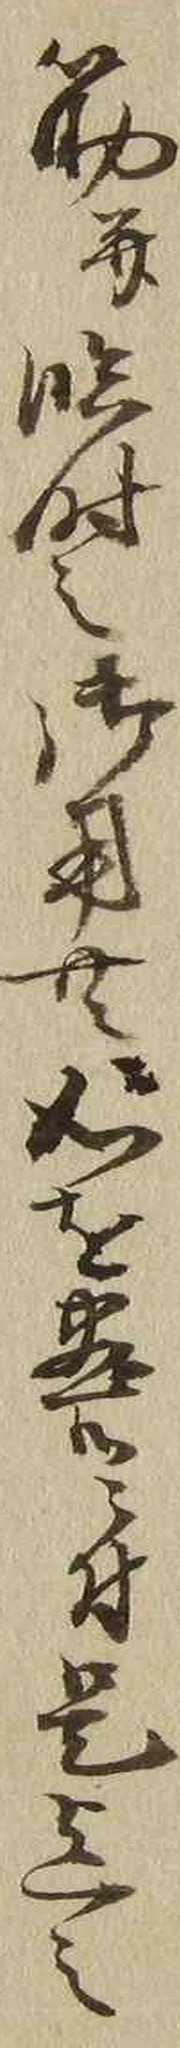筋幷臨時之御用共ニ心を尽候ニ付是迄之
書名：諸士系譜　巻之64　と之部7
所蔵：会津若松市立会津図書館
